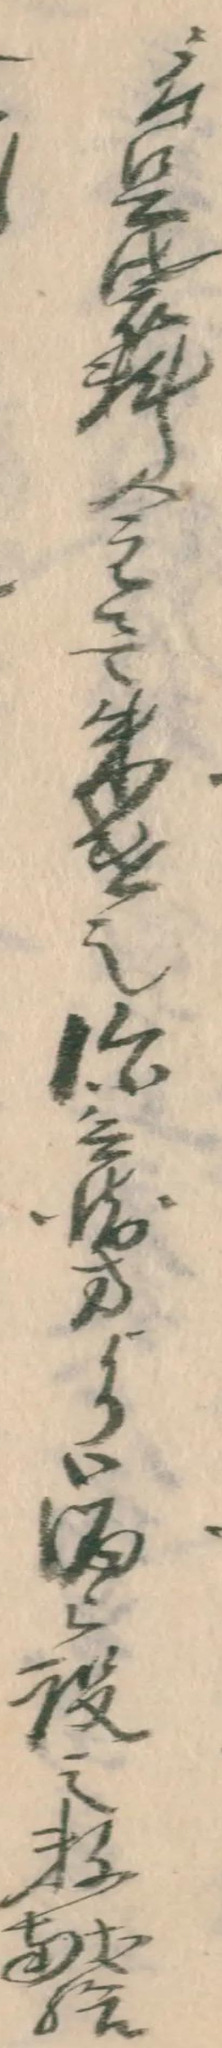ニ付是袋料金壱朱遣也弥兵衛方より御酒被役之数献結
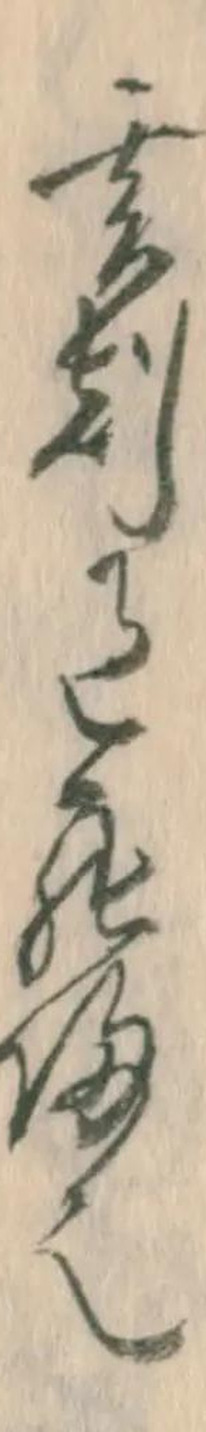亥刻過罷帰也
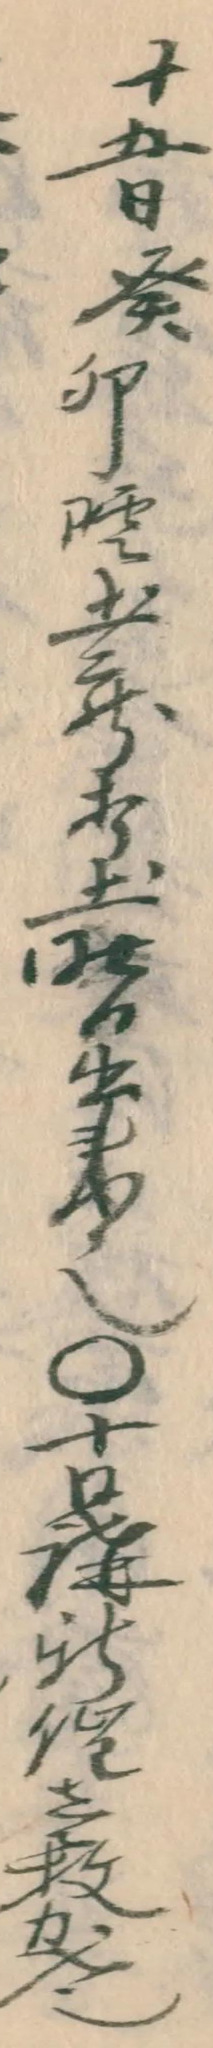十五日癸卯曇土蔵打出昨日出来也○十日講新催壱枚加登
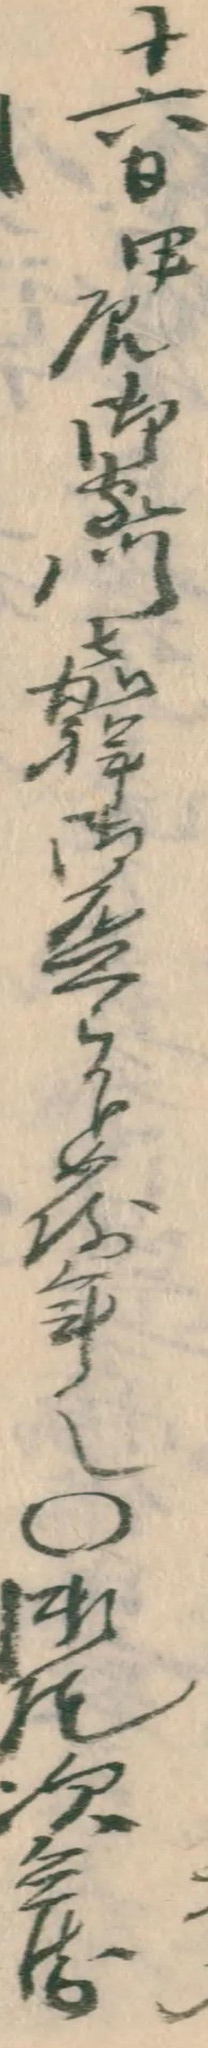十六日甲辰御家門を加様御盃被下如例年也○瀬尾次兵衛
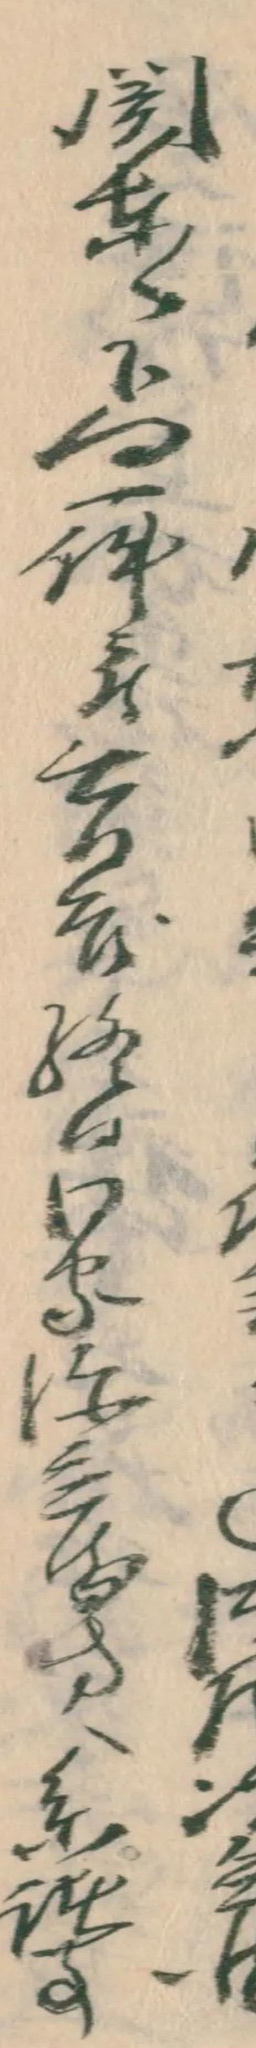関東へ下向一件ニ付今日も終日同家弥兵衛方へ参詣事
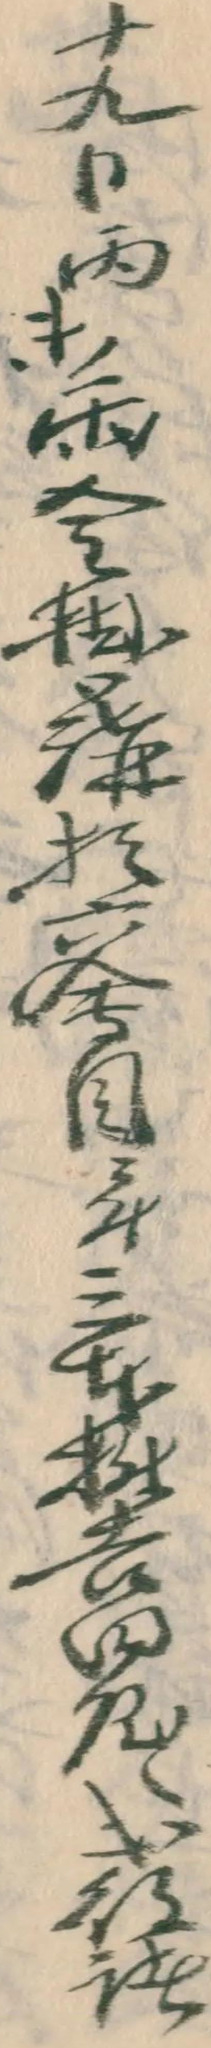十九日丙申雨金掛講拾六會目ニ付三本樹吉田屋へ出役諸
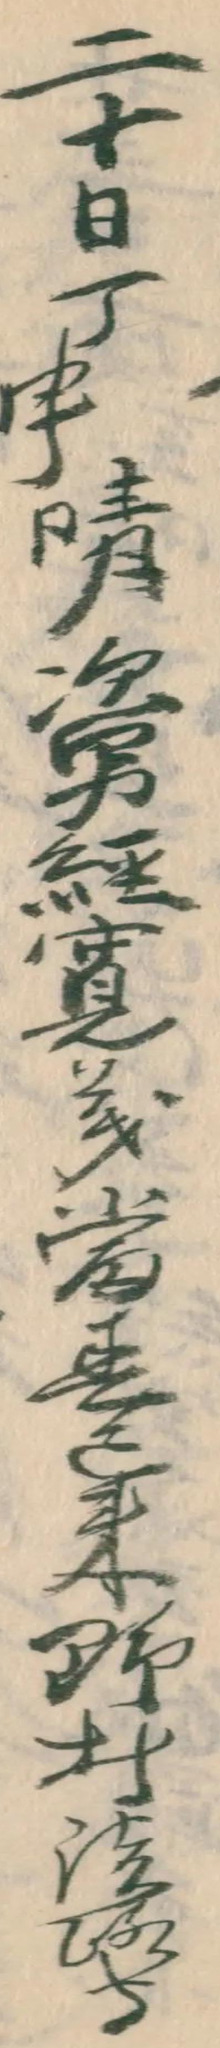二十日丁申晴次男経寛義當春已来野村淡路守
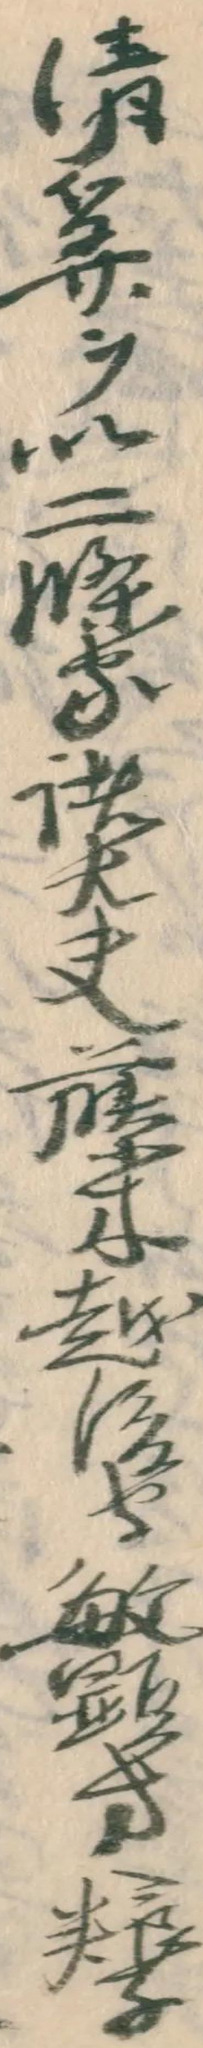清算ヲ以二條家諸大夫藤木越後守敏顕方へ養子
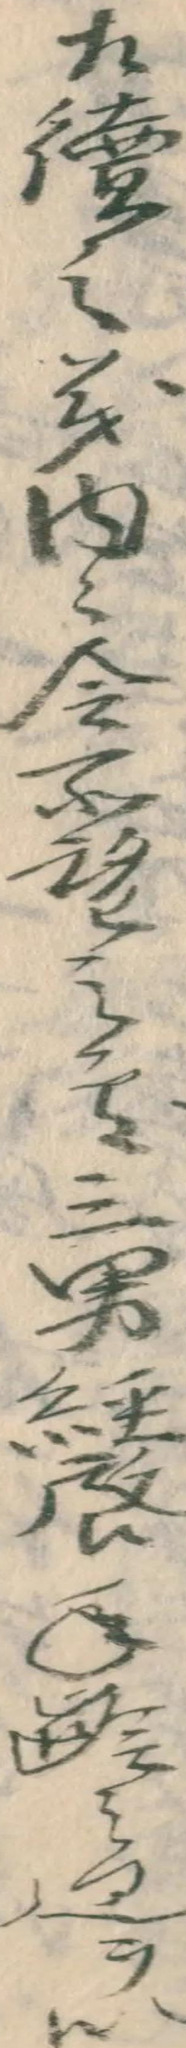相續之義内々令所望之處三男経啓年齢之邊ヲ以
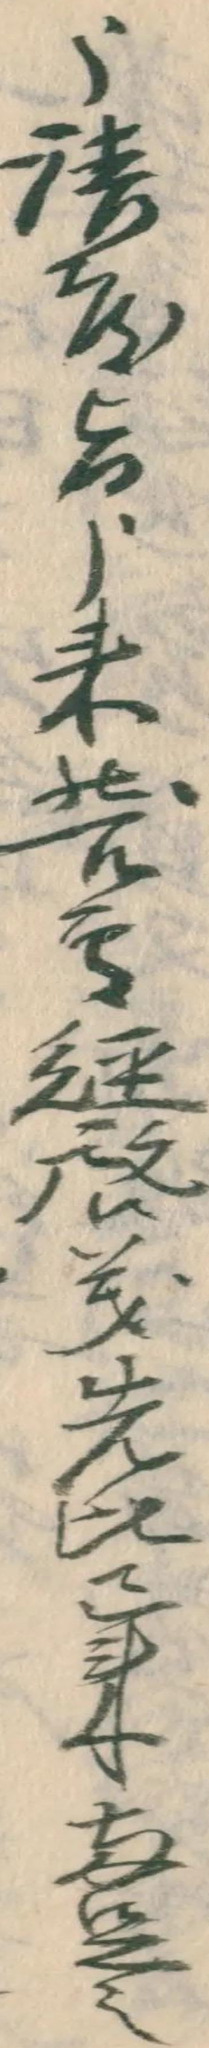申請度旨申来然候處経啓義先比已来両足之
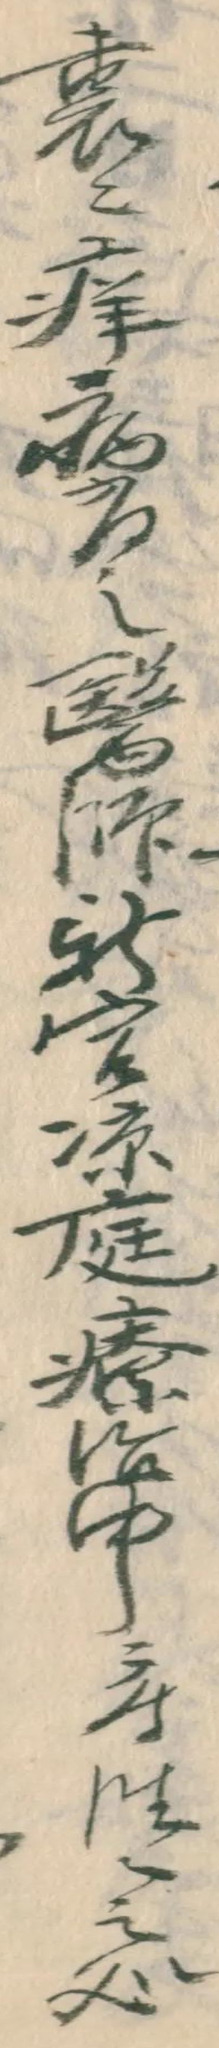裏二痒病有之醫師新宮涼庭療治中ニ付往々之処
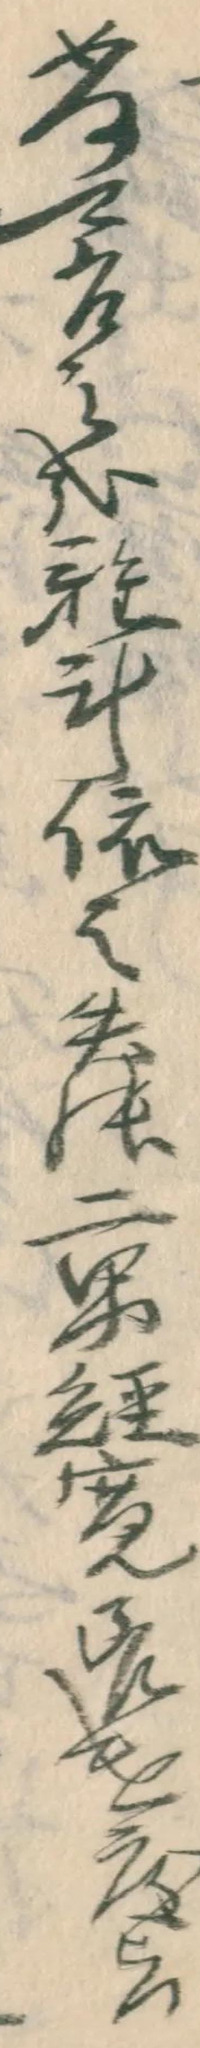如何可有之斗依之矢張二男経寛差遣度旨
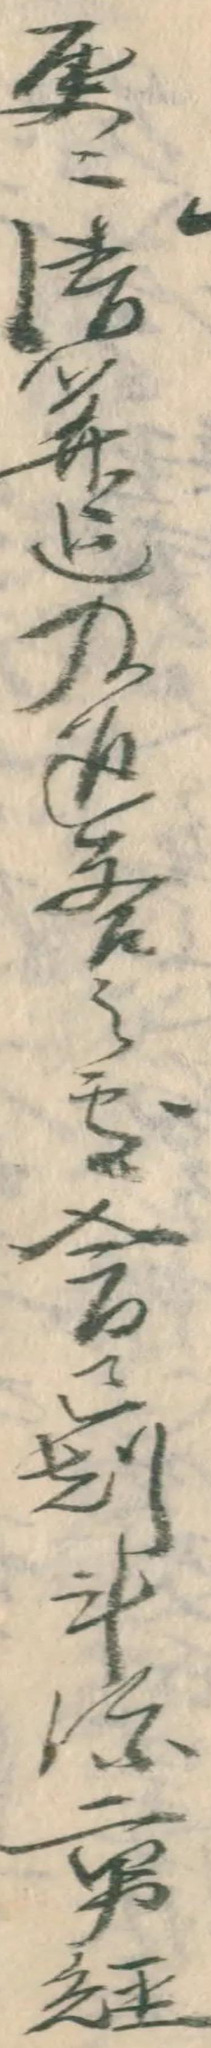更ニ清算迄及返答之處今日巳刻斗弥二男経
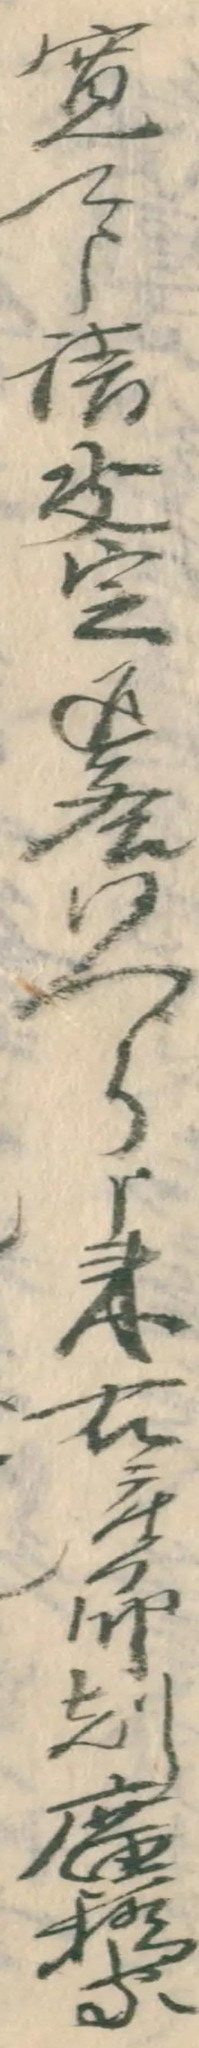寛可申請決定返答同人より申来右ニ付即刻廣橋家
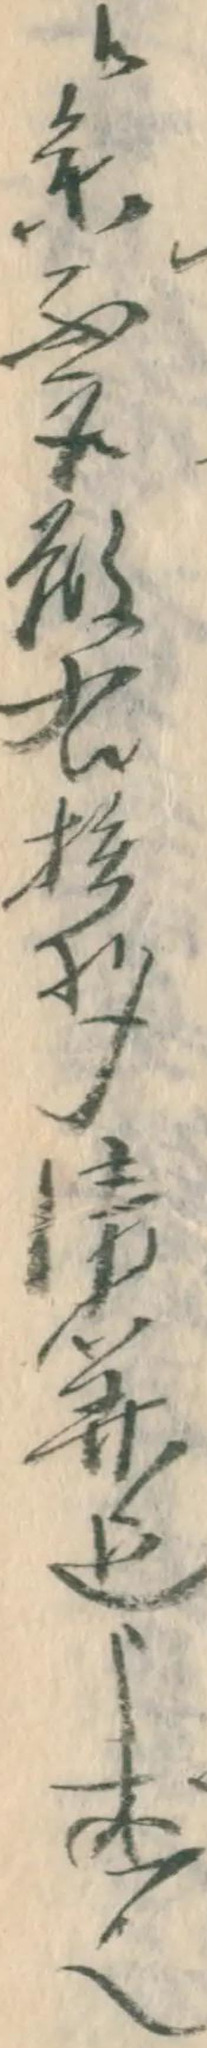え参不取敢右挨拶清算迄申述也

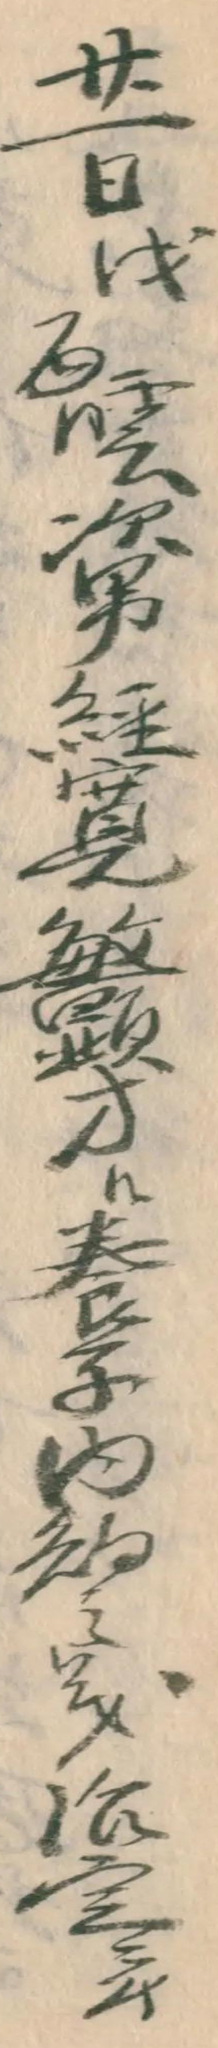廿一日戊酉曇次男経寛敏顕方え養子内約之義治定ニ付
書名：賀茂社記録. 第67冊
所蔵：国立国会図書館 National Diet Library, JAPAN
